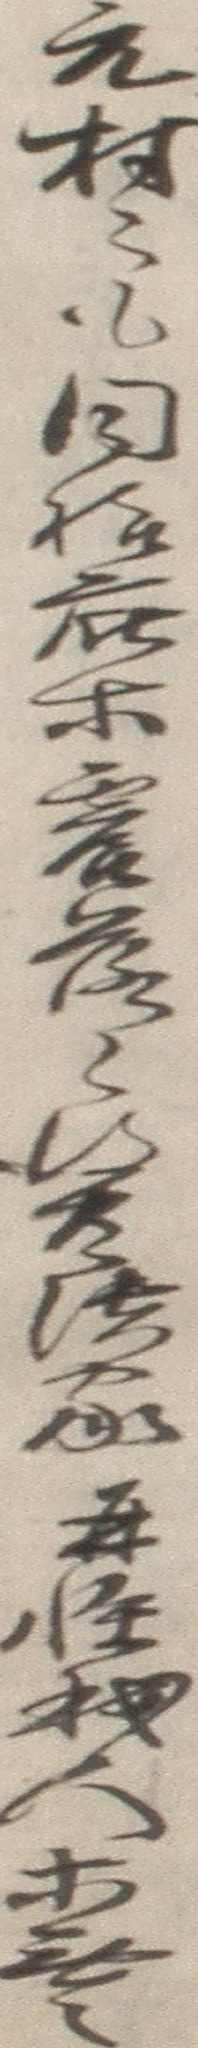元村二も同様庇等震落候得共潰家并怪我人等無之
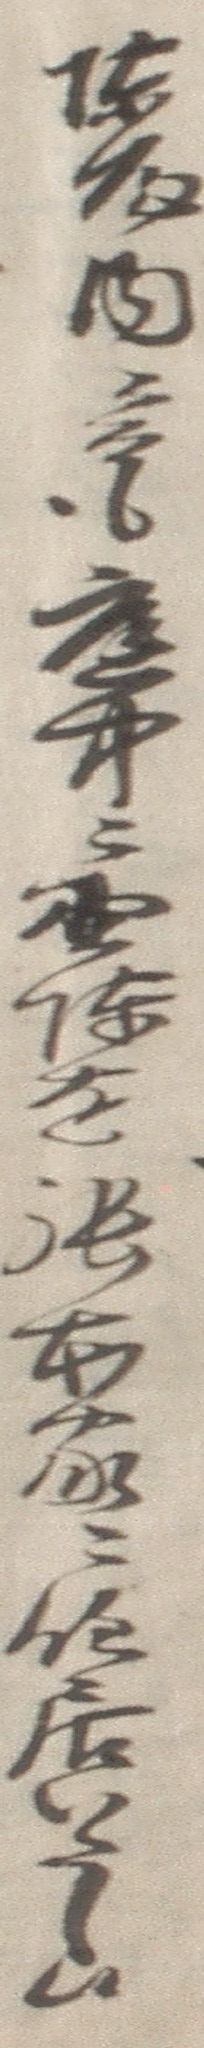陣屋内二而も庭中二野陣を張本家二住居いたし候
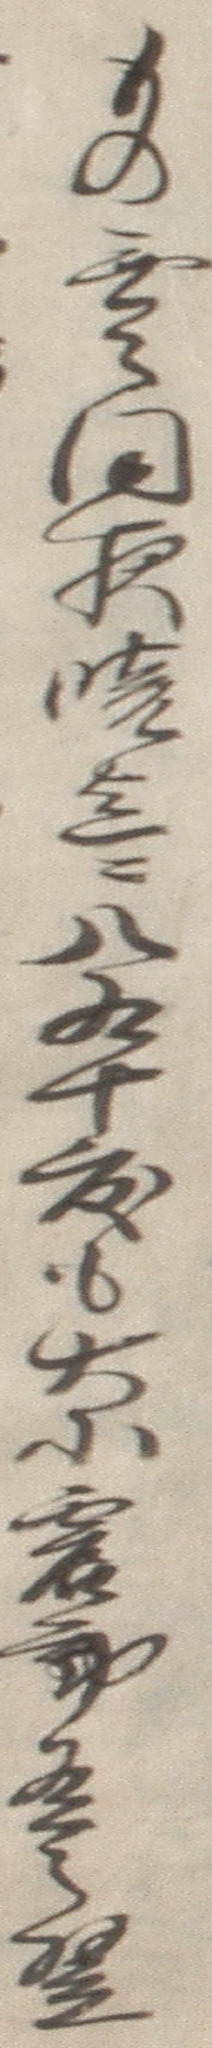もの無之同夜暁迄二八九十度も大小震動有之翌
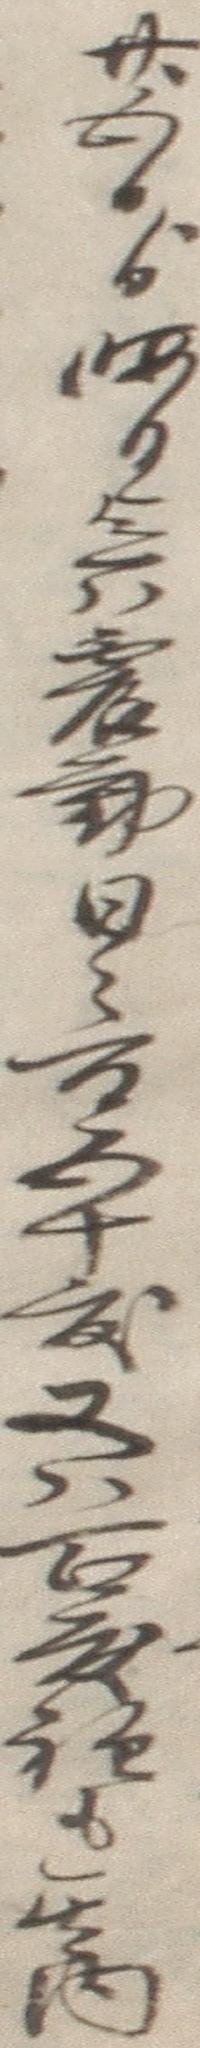廿五日ゟ晦日迄ハ震動日々百五十度又ハ百度程も其内
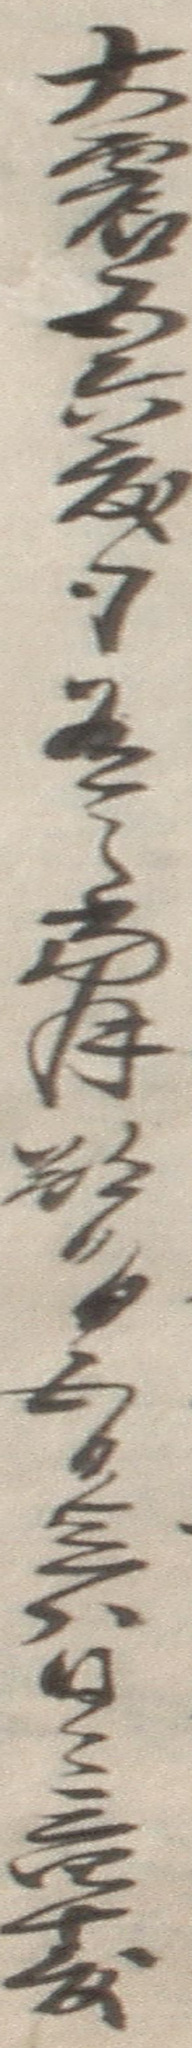大震五六度も有之当月朔日ゟ五日迄ハ日々三四十度
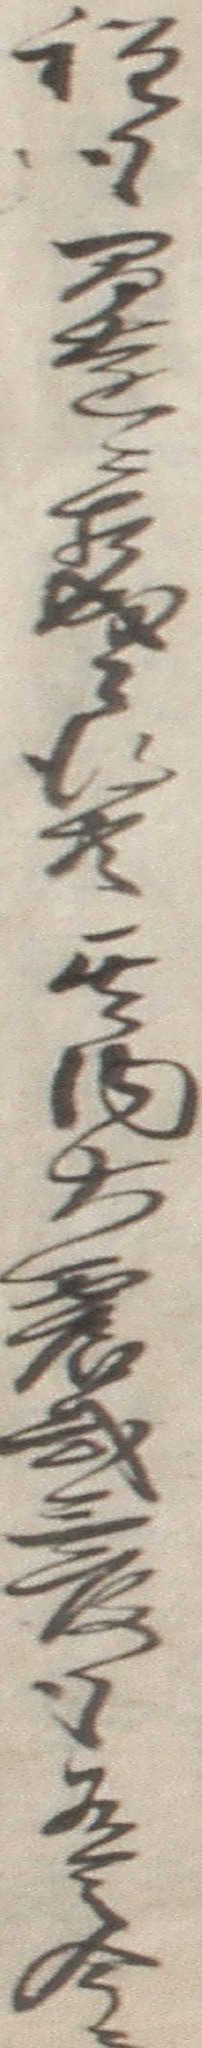程も間遠二相成候得共其内大震弐三度も有之今二
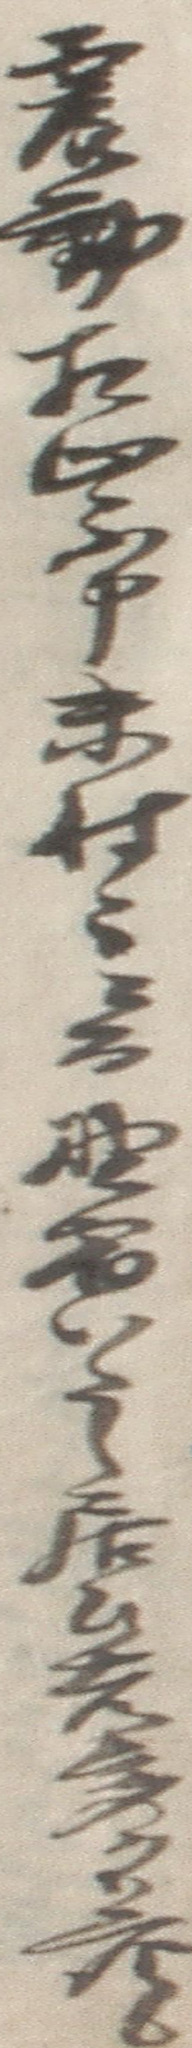震動相止不申未村々二而野宿いたし居候者多ク御座候
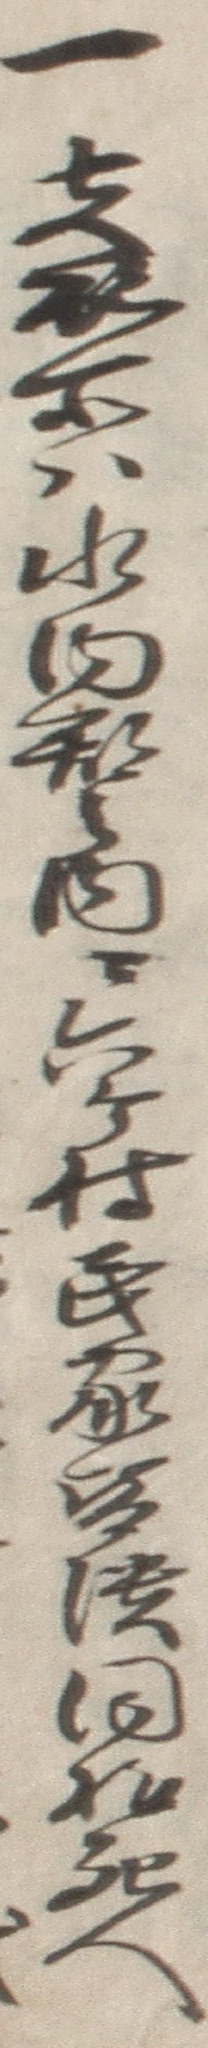一支配所ハ水内郡之内二六ヶ村民家皆潰同様死人
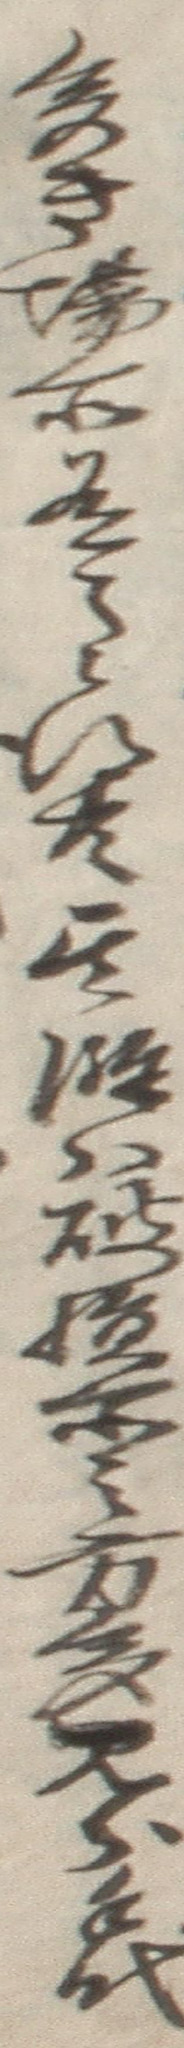多き場所有之候得共其餘ハ破損所之方多見分手代
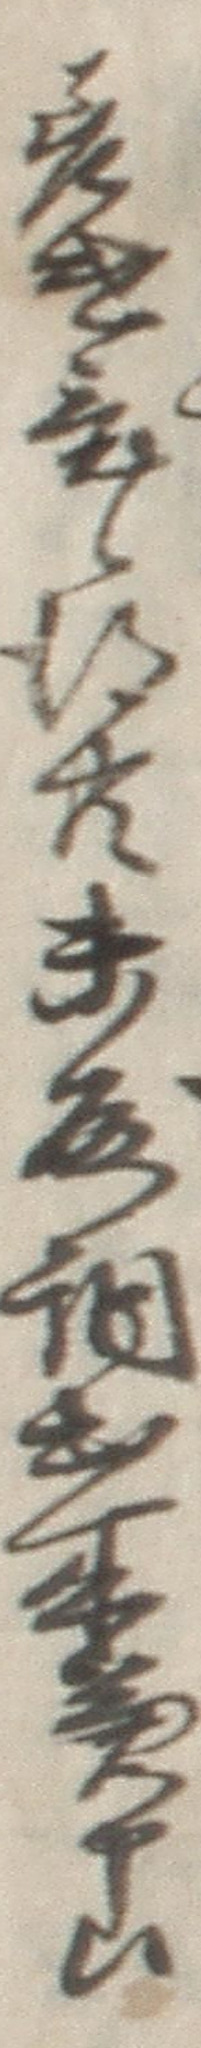差遣置候得共未取調出来兼申候

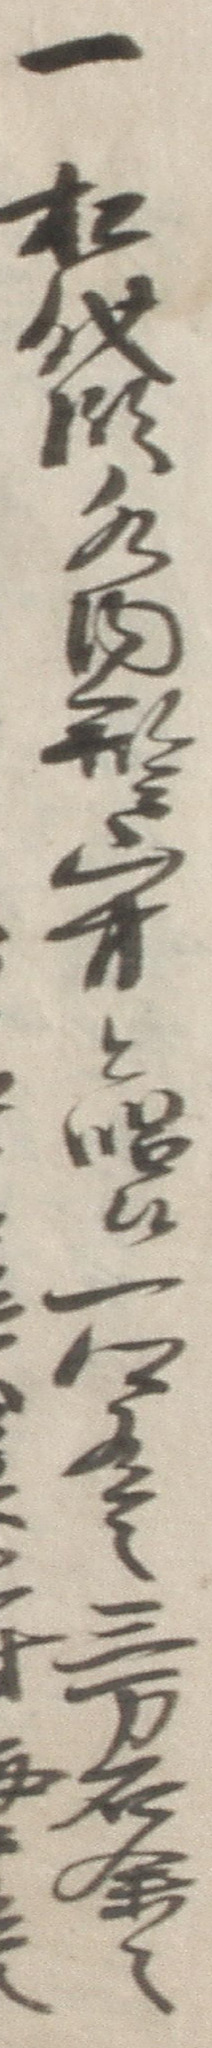一松代領水内郡二山中と唱候一郷有之三万石余之
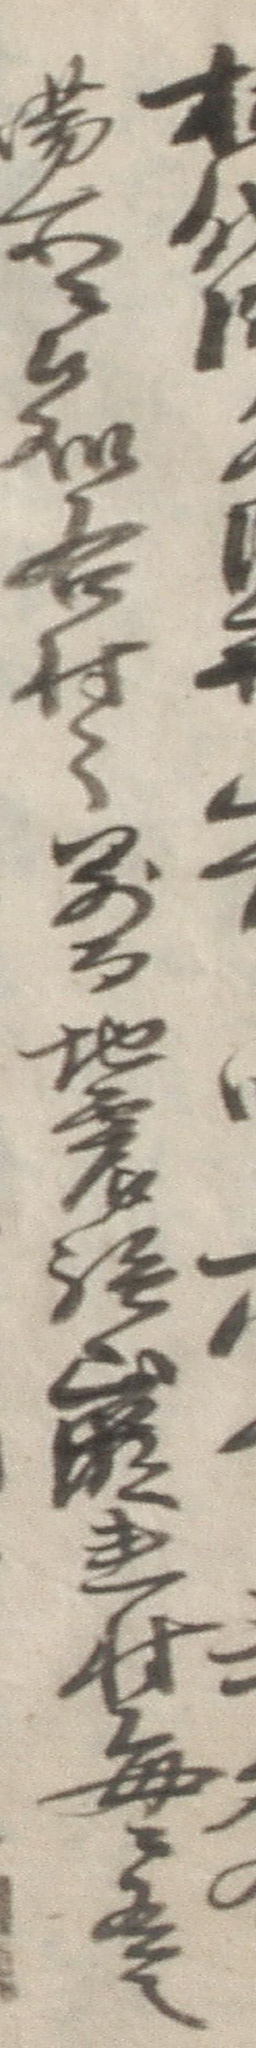場所二候処右村々別而地震強山崩れ村毎二有之
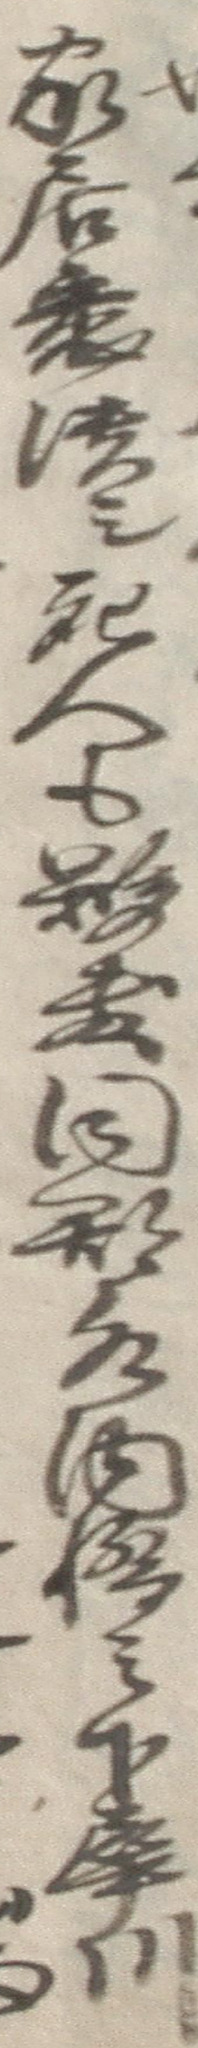家居悉潰ㇱ死人も夥敷同郡水内橋之下犀川
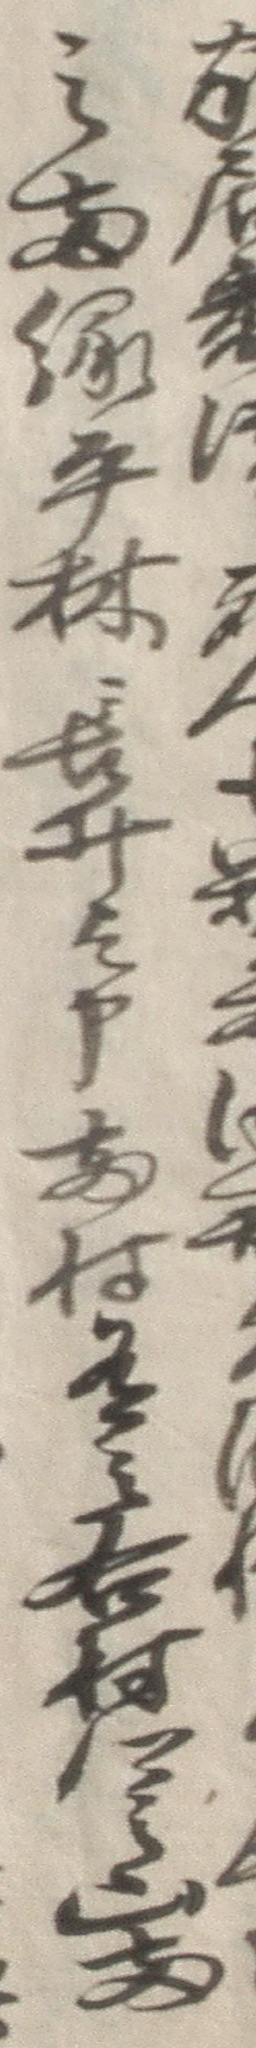之南縁平林二長井と申両村有之右村郷之山両
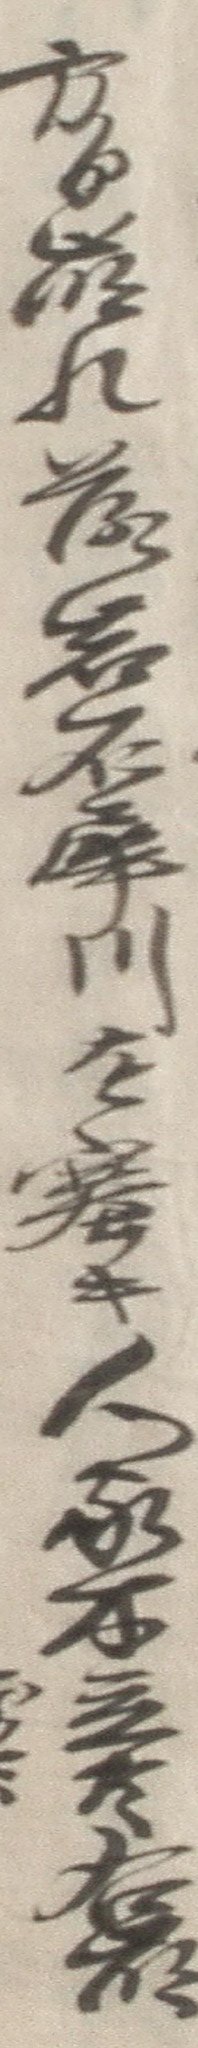方ゟ崩れ落岩石犀川塞き人家木立共右於
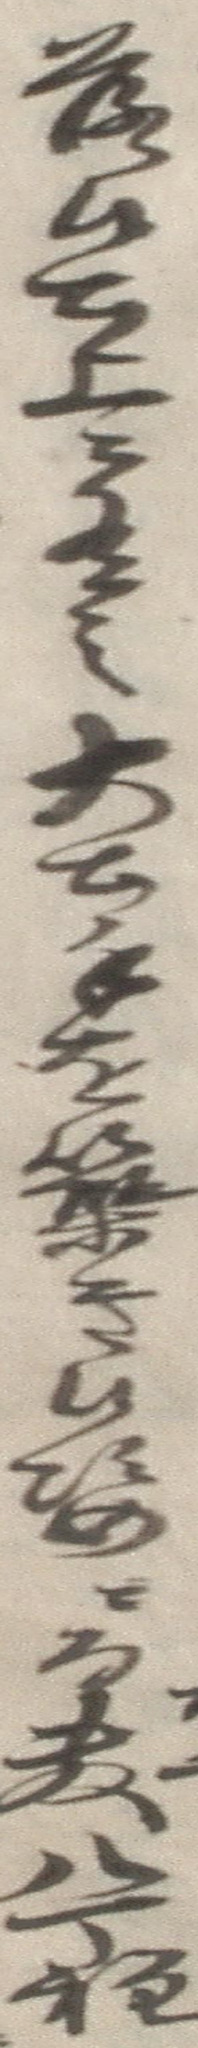落候土上二有之大土手を築キ候姿二而敷八丁程
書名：信州地震一件
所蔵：東京大学地震研究所図書室 Earthquake Research Institute Library, The University of Tokyo, JAPAN
